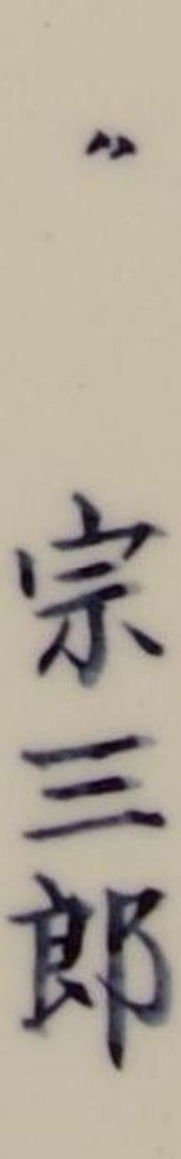宗三郎
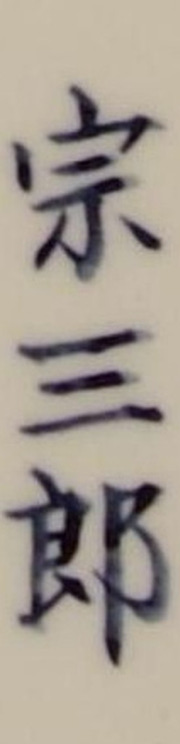宗三郎
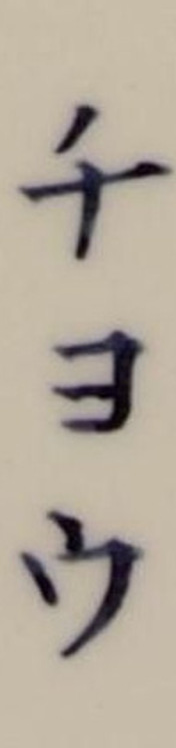チョウ
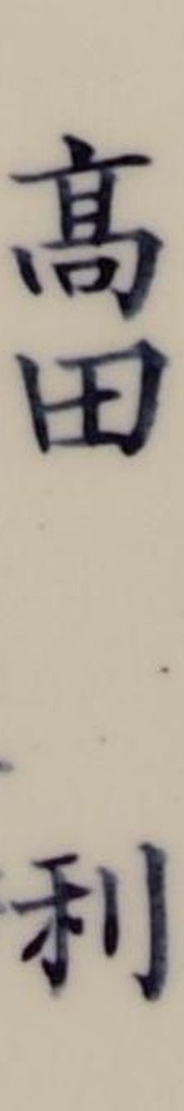高田利
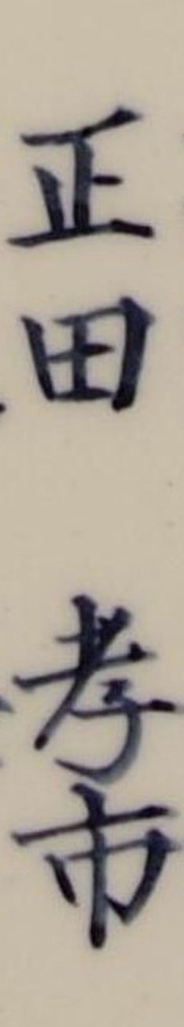正田孝市
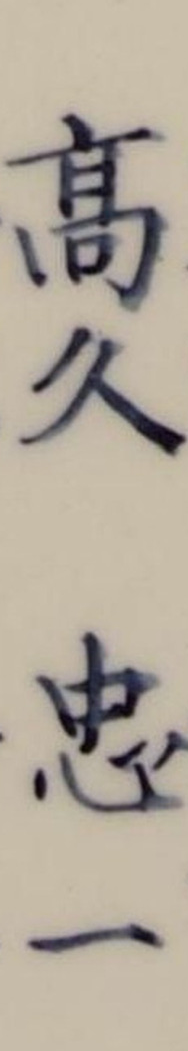高田忠一
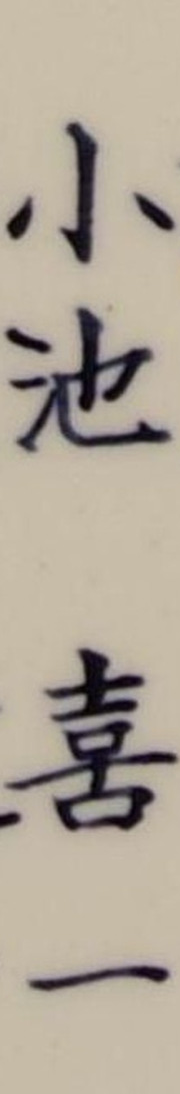小池喜一
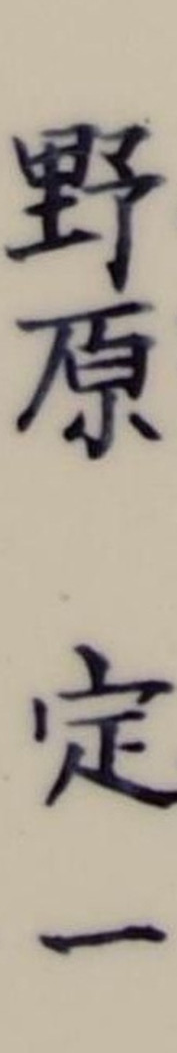野原定一
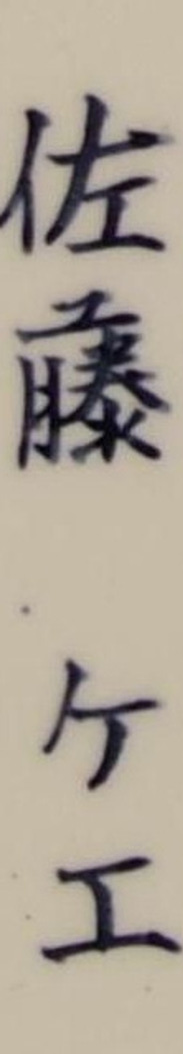佐藤ケエ
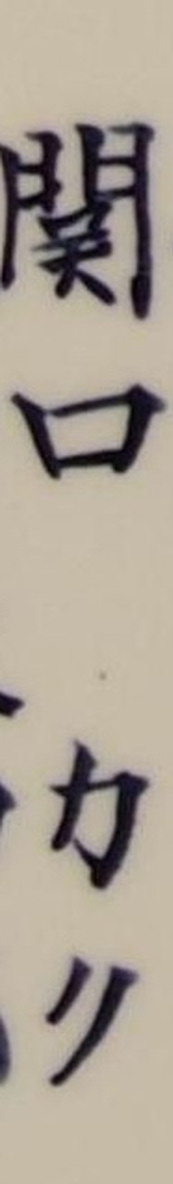関口カク
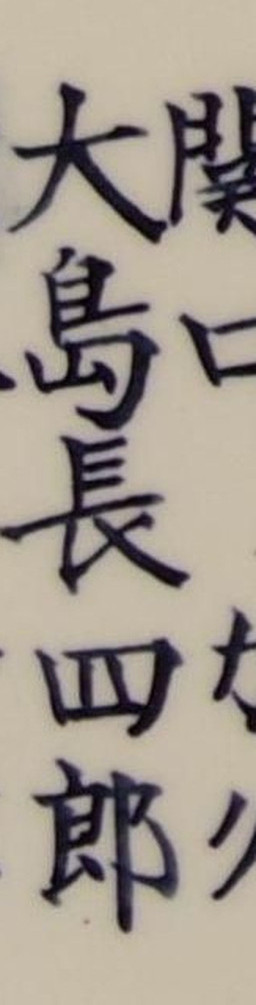大島長四郎
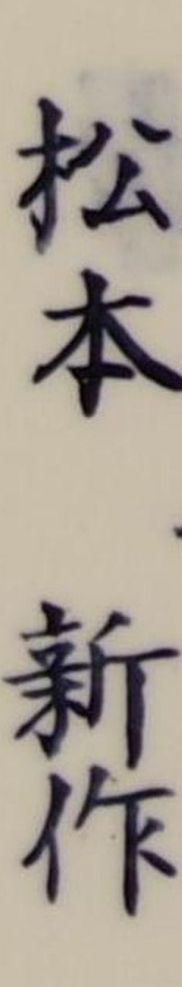松本新作

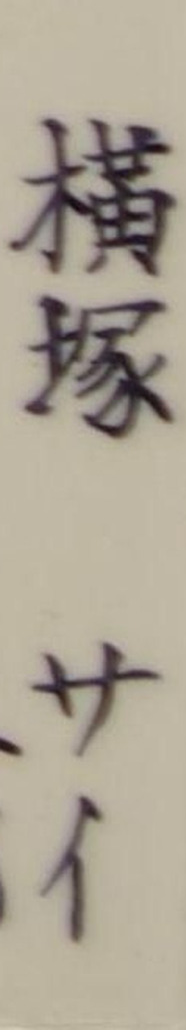横塚サイ
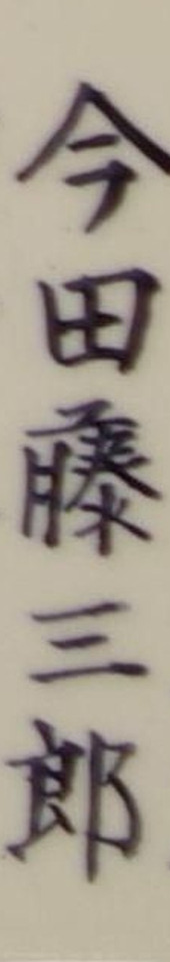今田藤三郎
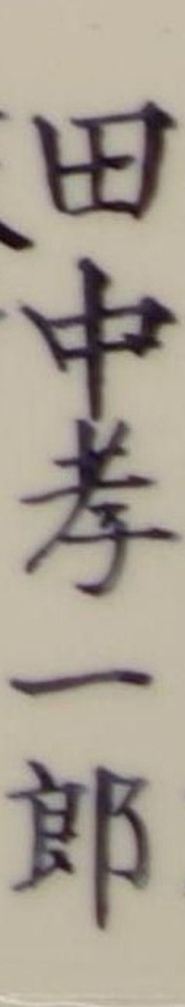田中孝一郎
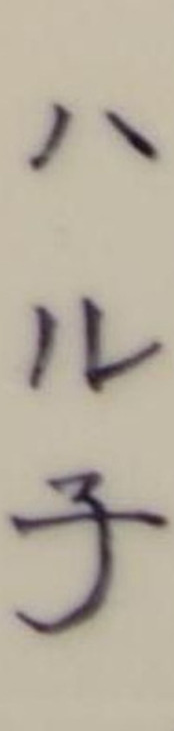ハル子
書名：E~L
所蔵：高野山金剛峯寺
